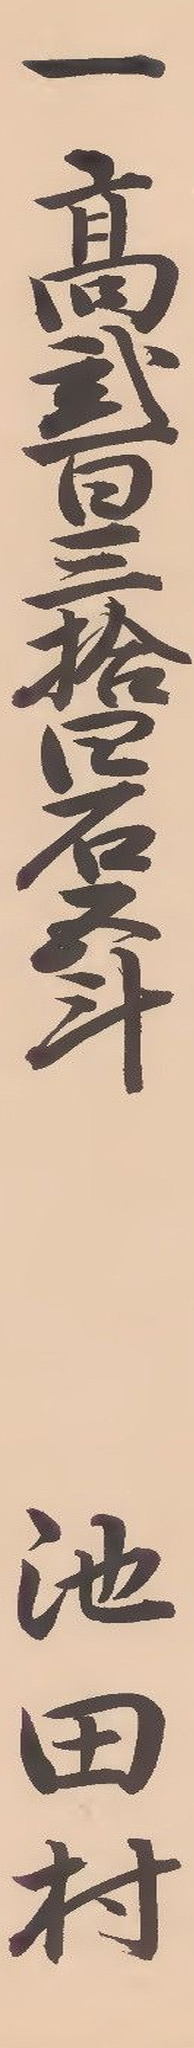一高弐百三拾四石五斗池田村

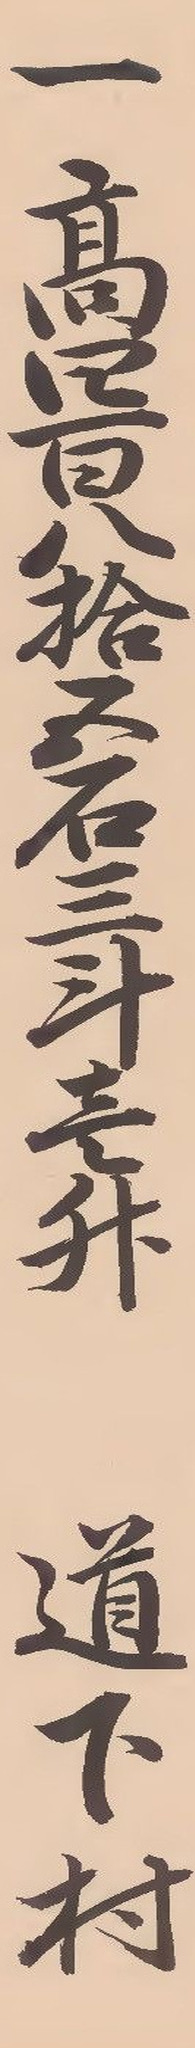一高四百八拾五石三斗壱升道下村
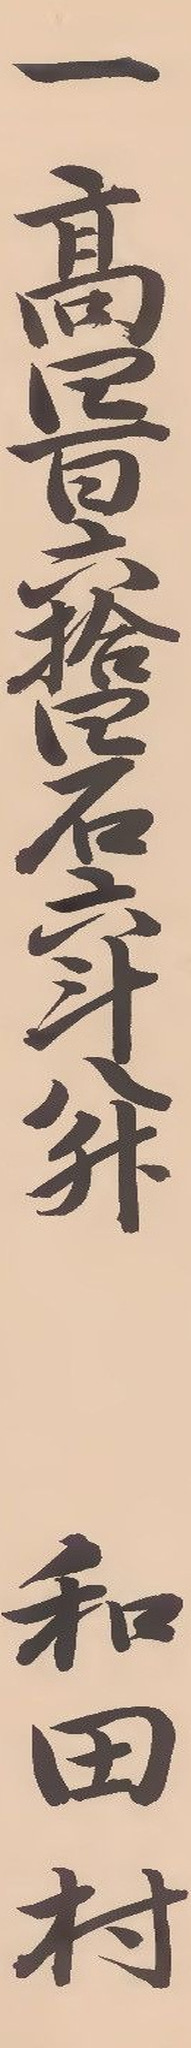一高四百六拾四石六斗八升和田村
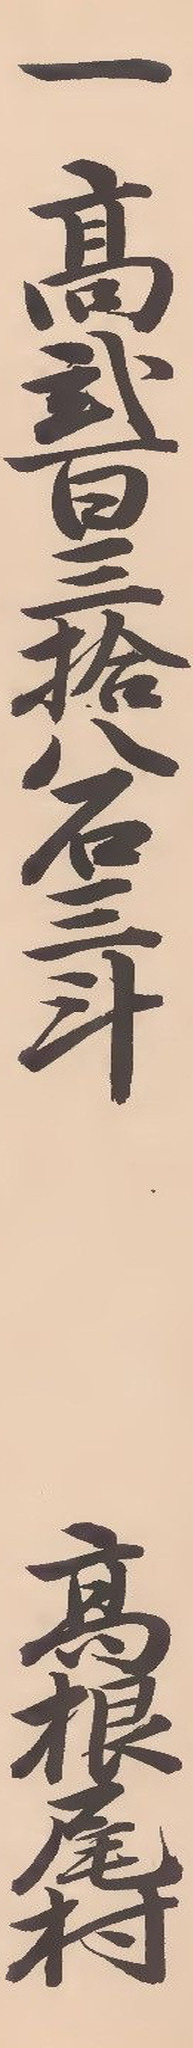一高弐百三拾八石三斗高根尾村
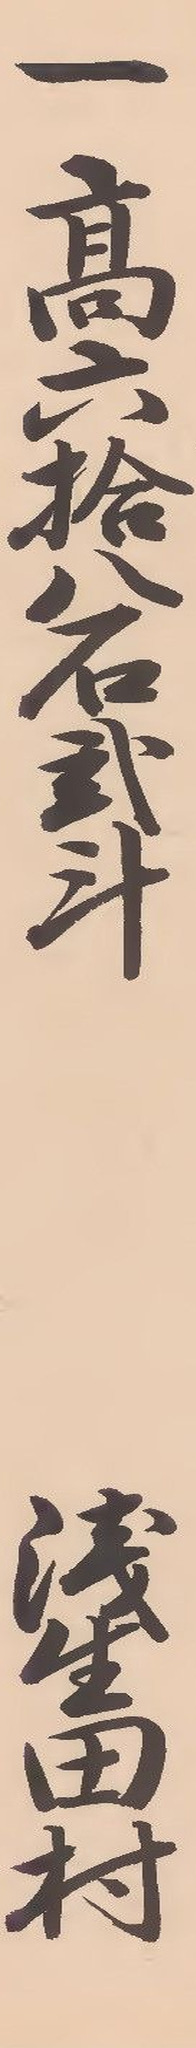一高六拾八石弐斗浅生田村
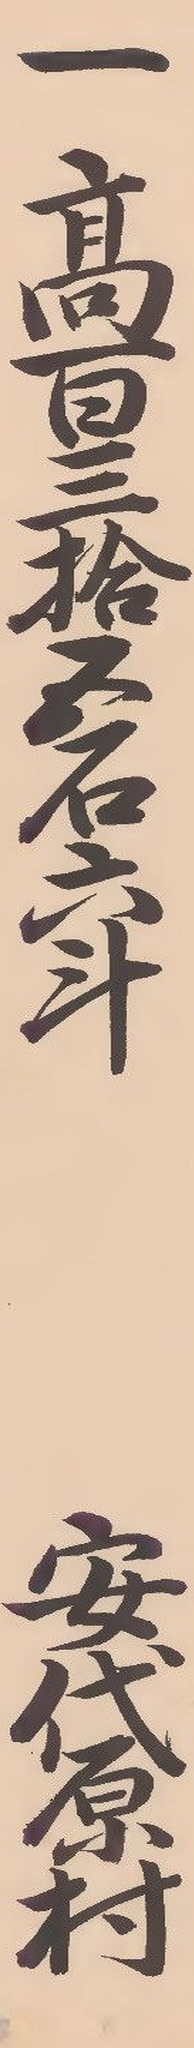一高百三拾五石六斗安代原村

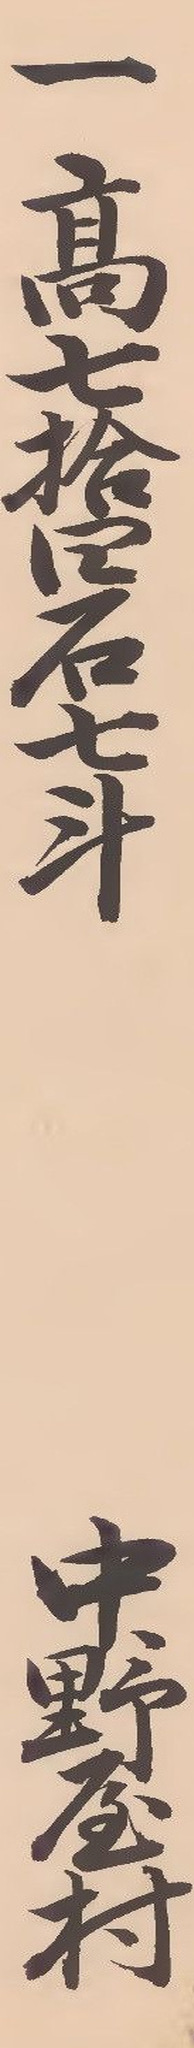一高七拾四石七斗中野屋村
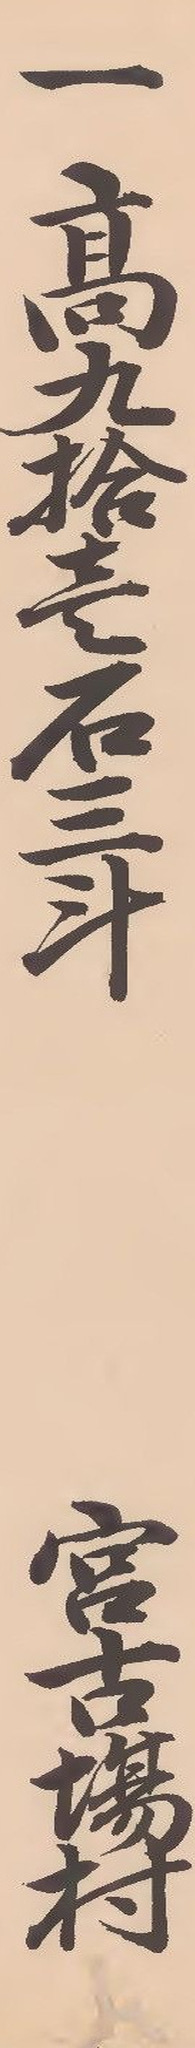一高九拾壱石三斗宮古場村
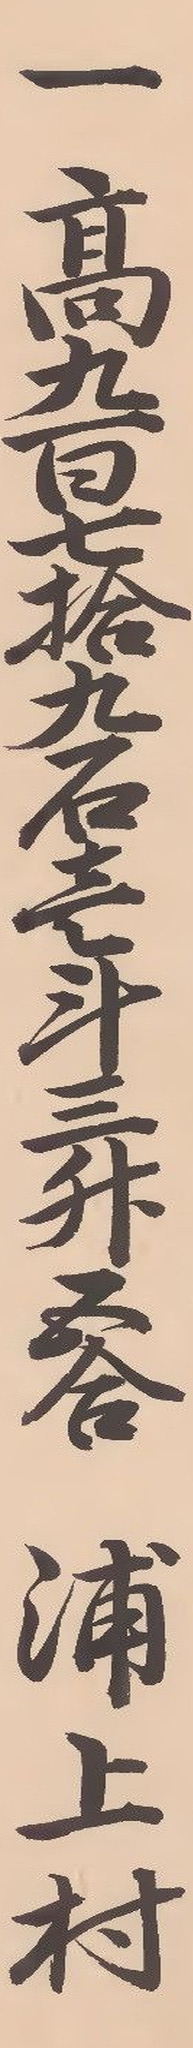一高九百七拾九石壱斗三升五合浦上村
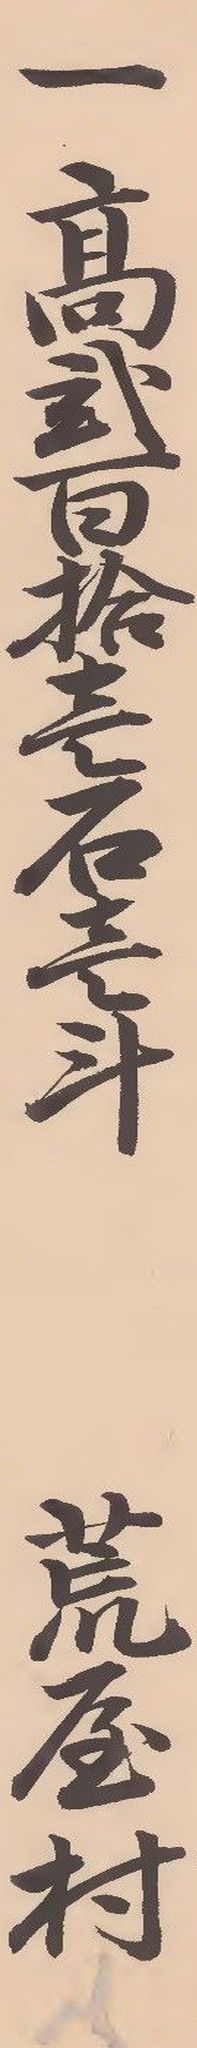一高弐百拾壱石壱斗荒屋村
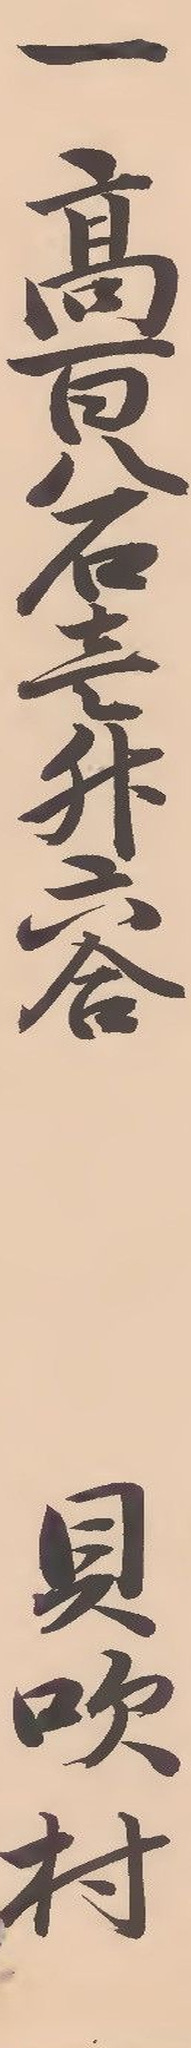一高百八石壱升六合貝吹村

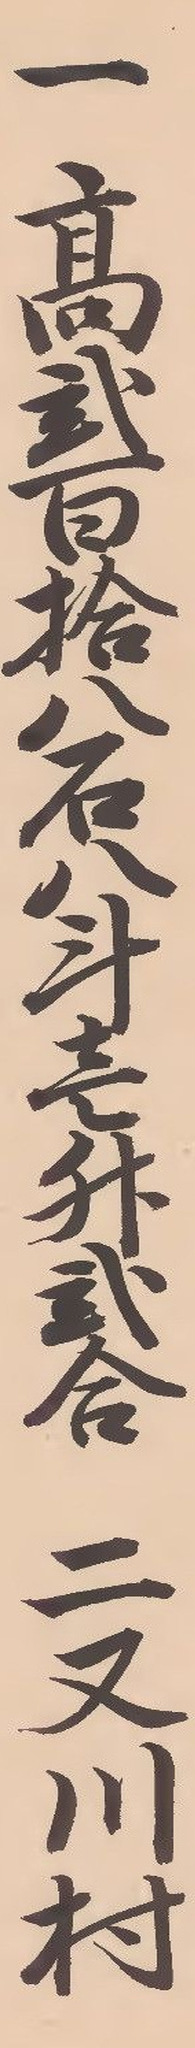一高弐百拾八石八斗壱升弐合二又川村
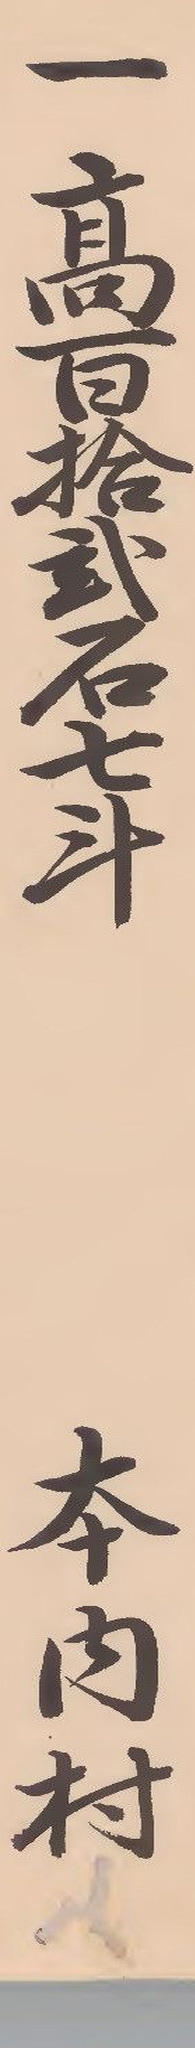一高百拾弐石七斗本内村

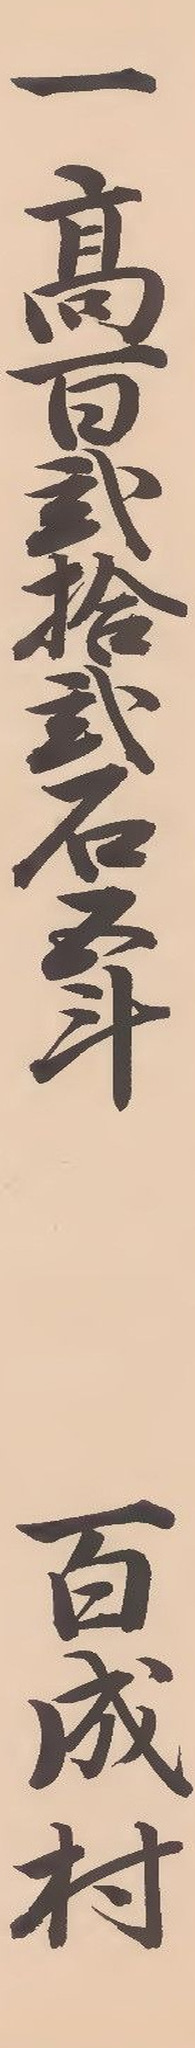一高百弐拾弐石五斗百成村
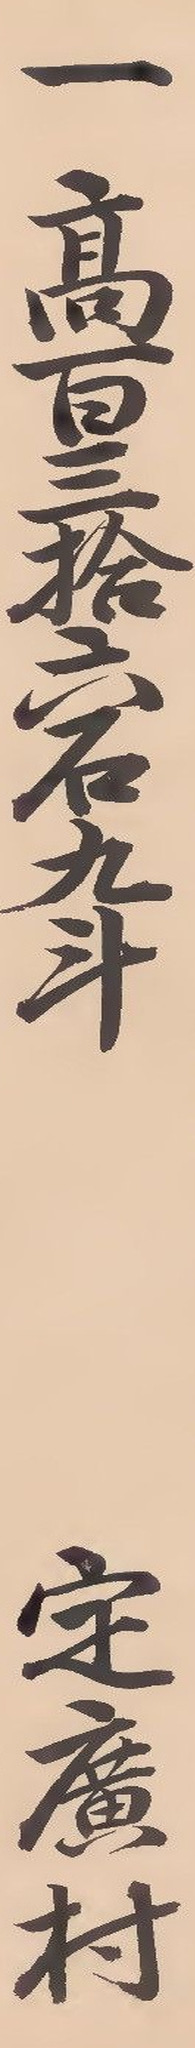一高百三拾六石九斗定広村
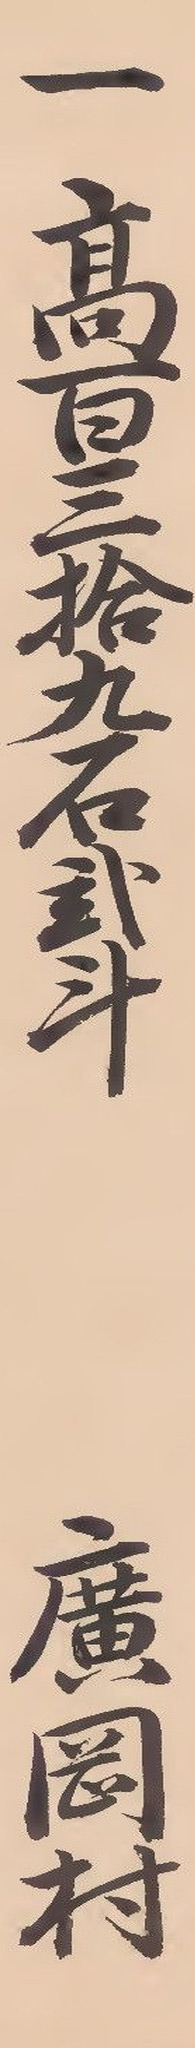一高百三拾九石弐斗広岡村
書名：能登国郷帳
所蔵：国立公文書館 National Archives of Japan
